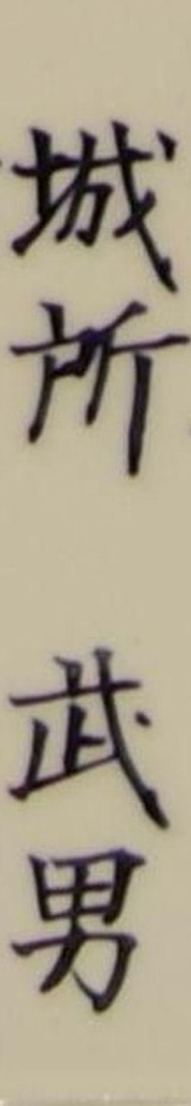城所武男
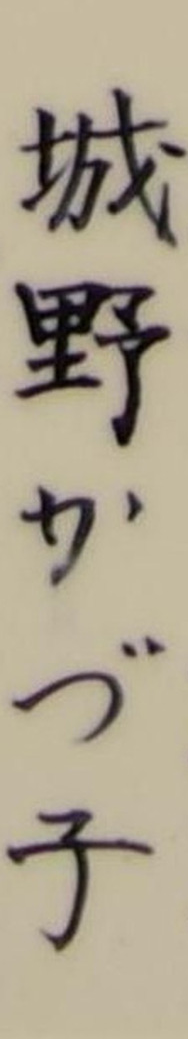城野かづ子
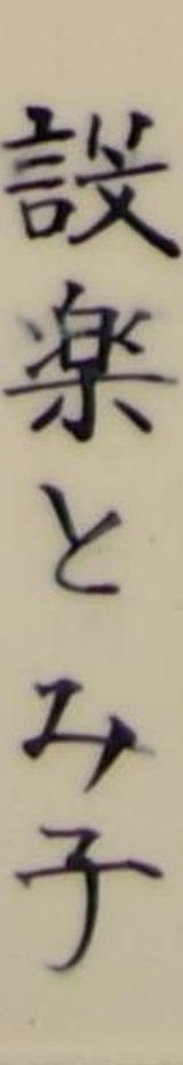設楽とみ子
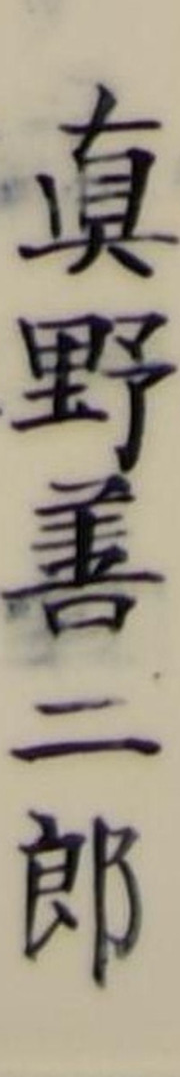真野善二郎
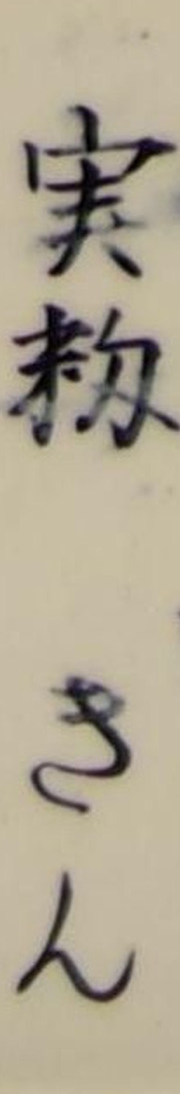実籾きん
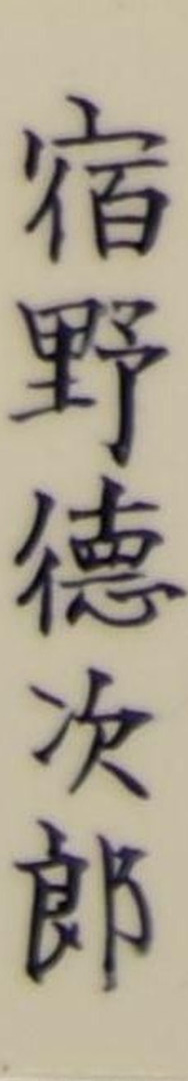宿野徳次郎
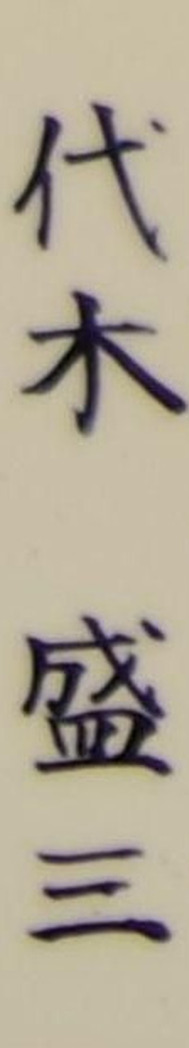代木盛三

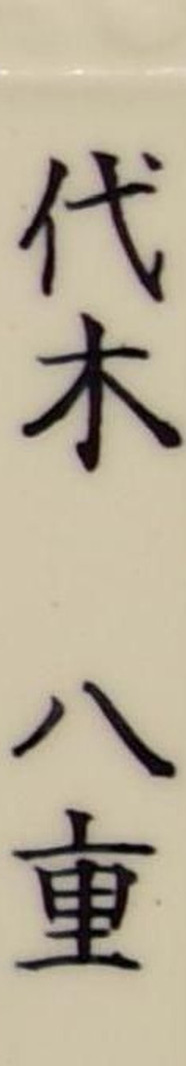代木八重
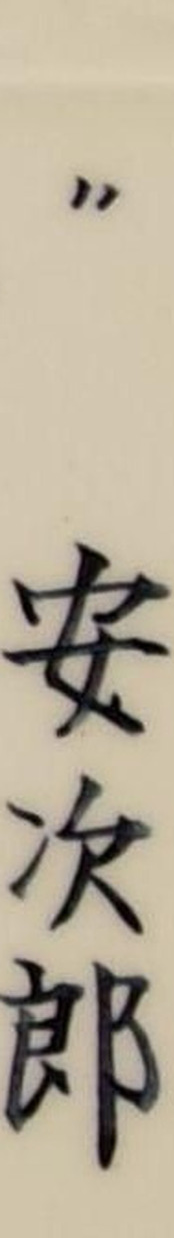安次郎
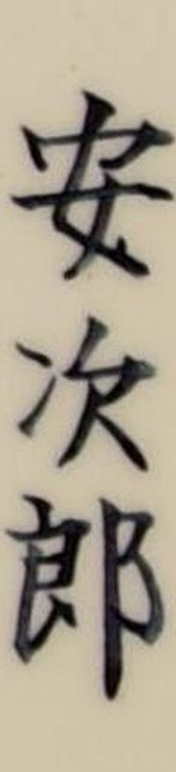安次郎
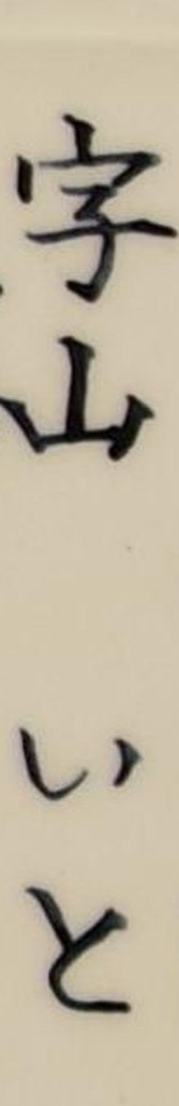字山いと
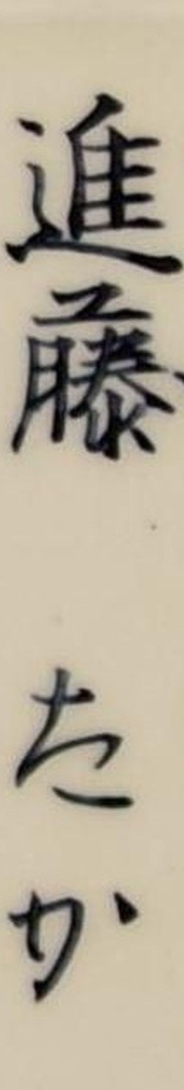進藤たか
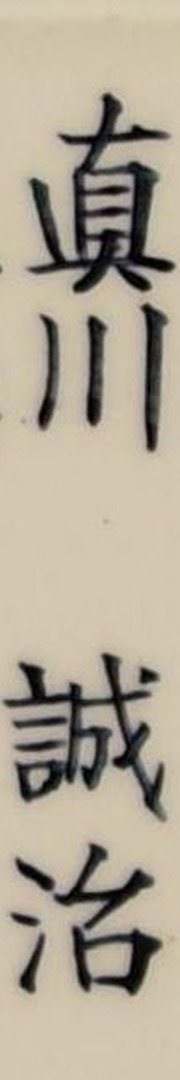真川誠治
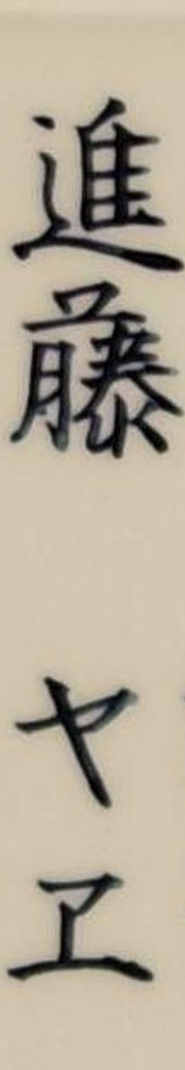進藤ヤヱ
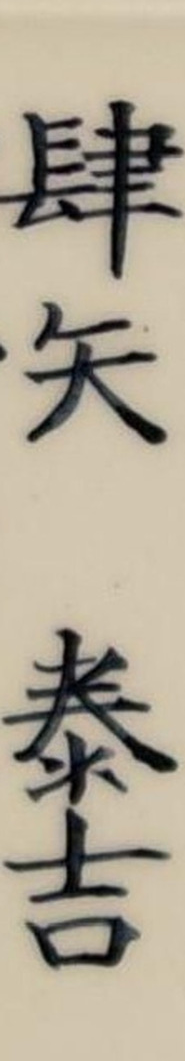肆矢泰吉
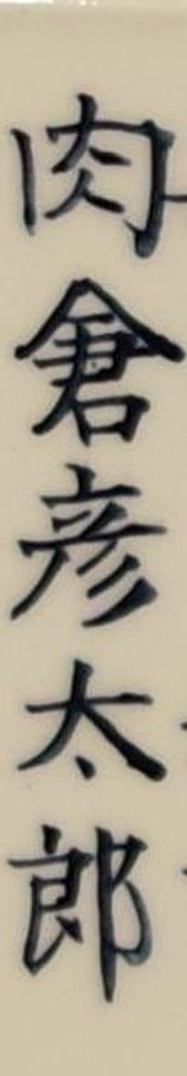肉倉彦太郎
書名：A~D
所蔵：koyasan kongobuji
